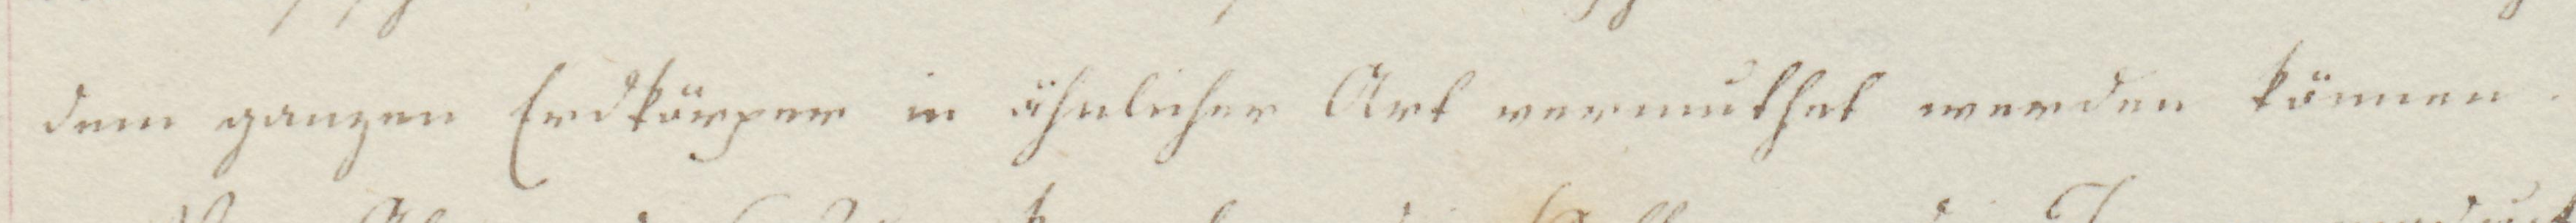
dem ganzen Erdkörper in ähnlicher Art vermuthet werden können.
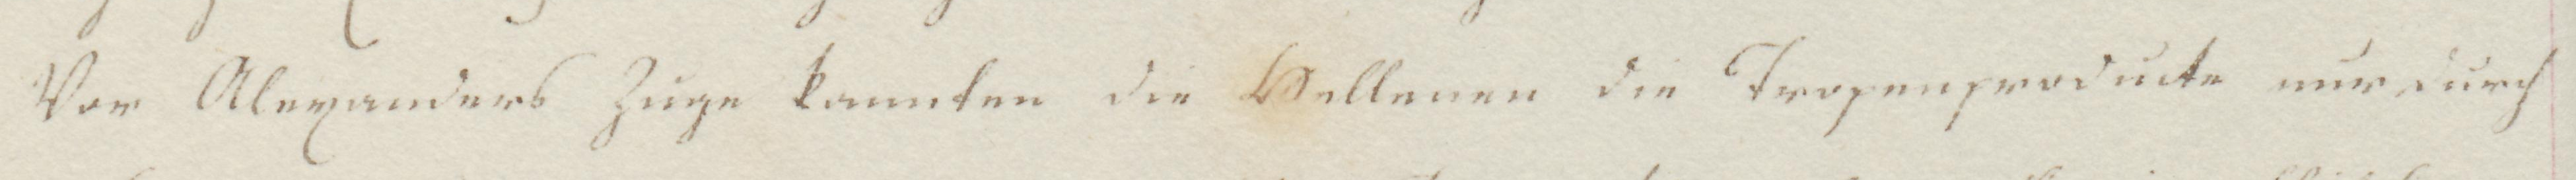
Vor Alexanders Zuge kannten die Hellenen die Tropenproducte nur durch
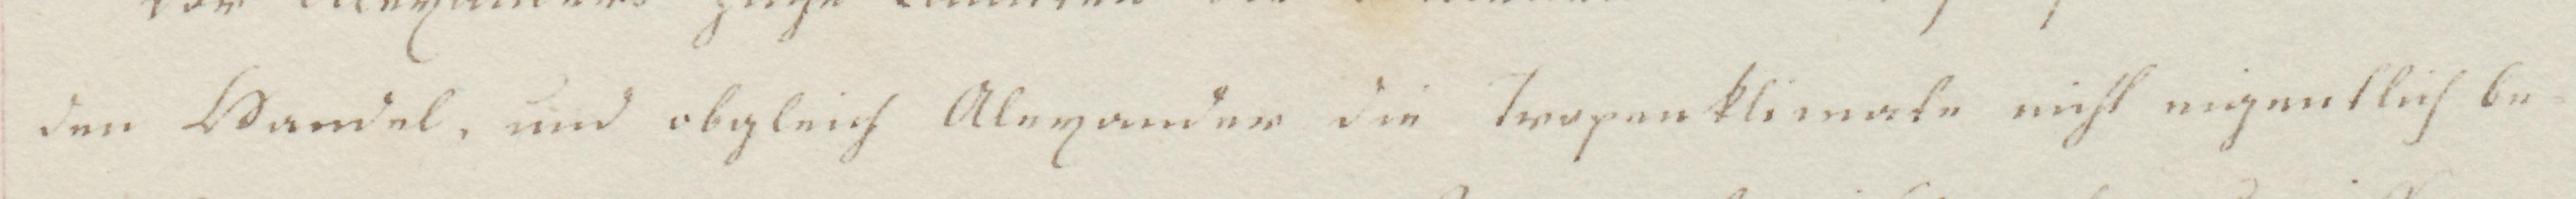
den Handel, und obgleich Alexander die Tropenklimate nicht eigentlich be-
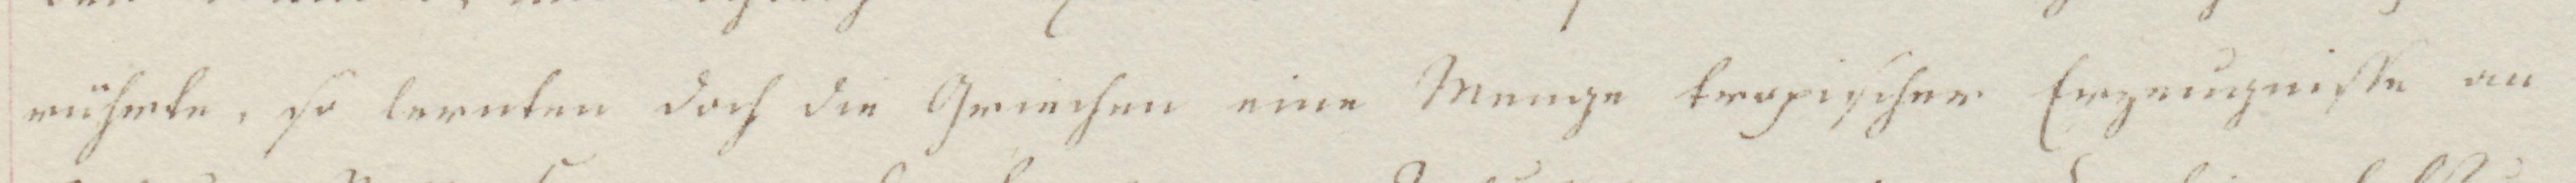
rührte, so lernten doch die Griechen eine Menge tropischer Erzeugnisse an
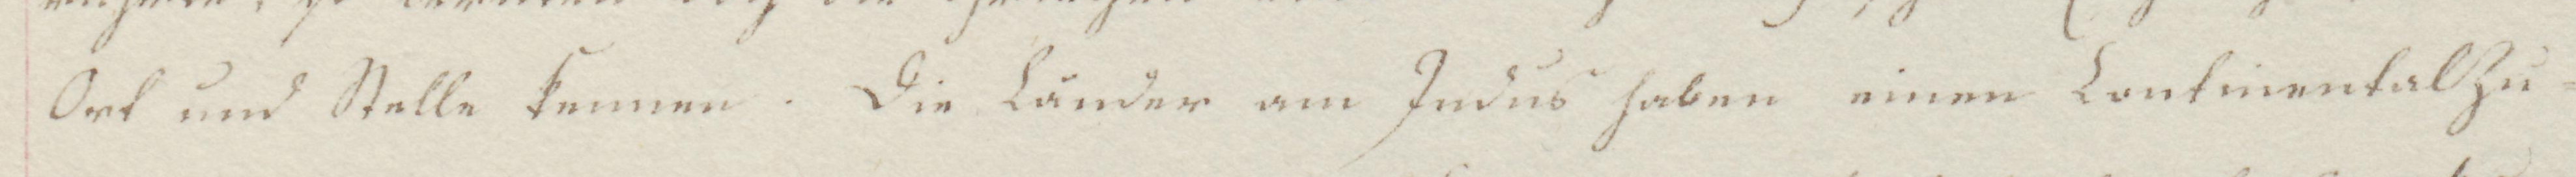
Ort und Stelle kennen. Die Länder am Indus haben einen ContinentalZu-
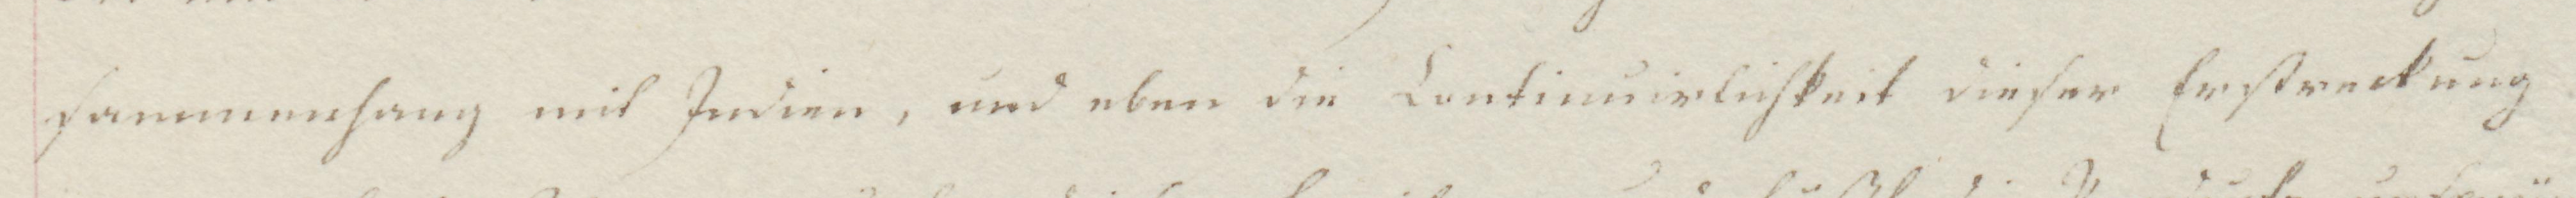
sammenhang mit Indien, und eben die Continuirlichkeit dieser Erstreckung
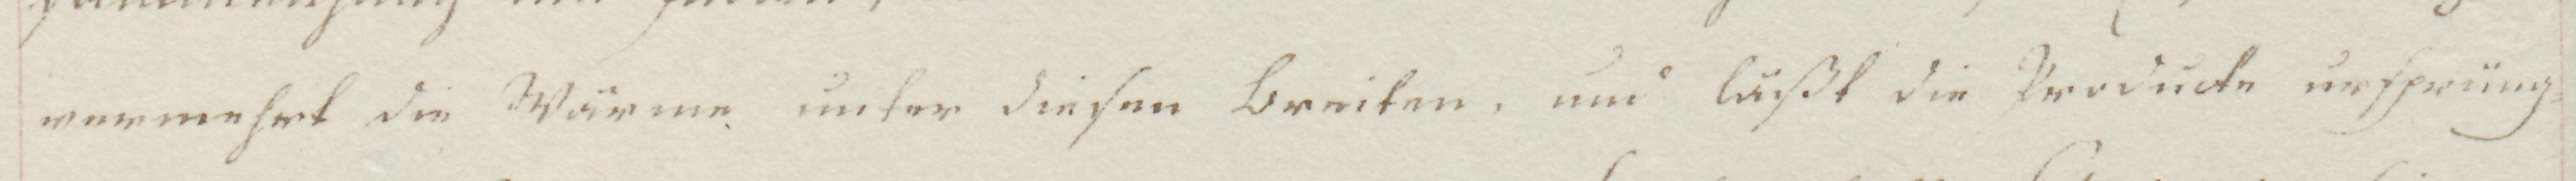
vermehrt die Wärme unter diesen Breiten, und läßt die Producte ursprüng-
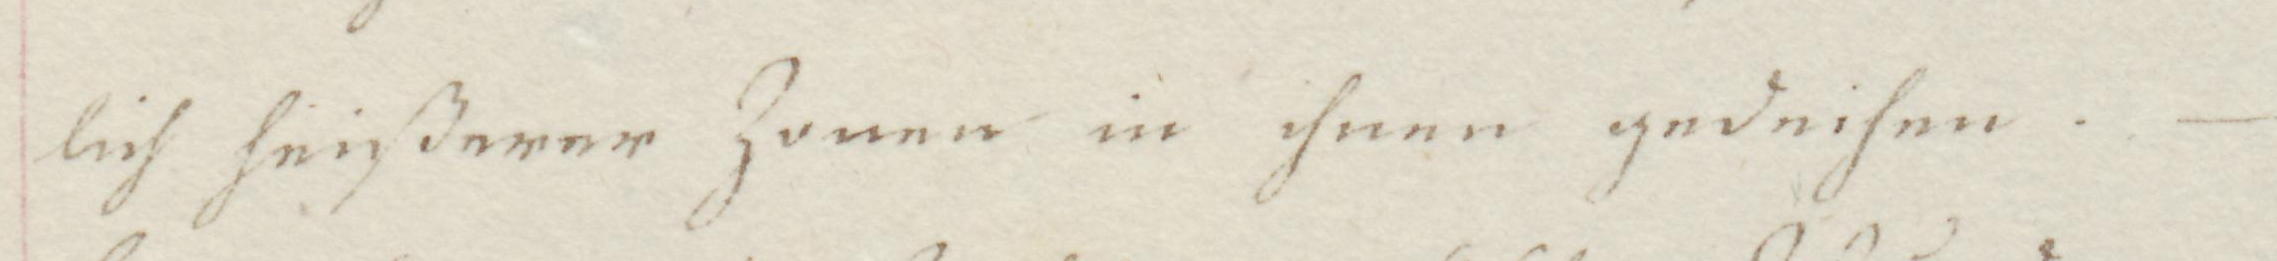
lich heißerer Zonen in ihnen gedeihen. –
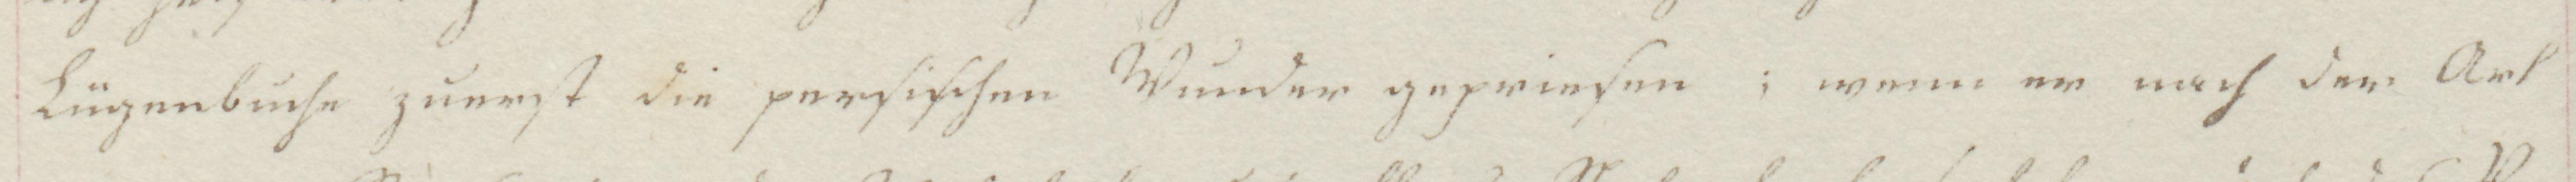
Lügenbuche zuerst die persischen Wunder gepriesen; wenn er nach der Art
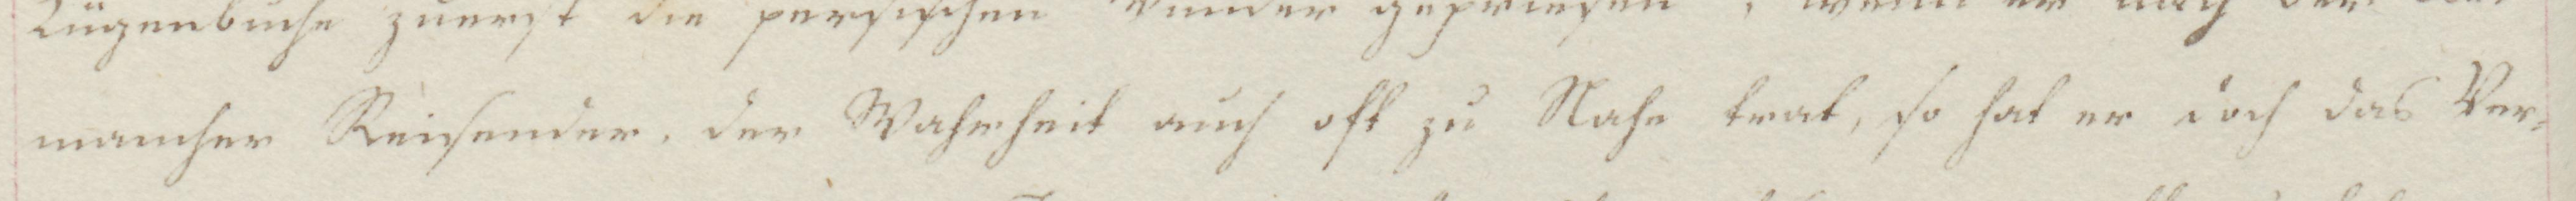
mancher Reisender, der Wahrheit auch oft zu Nahe trat, so hat er doch das Ver-
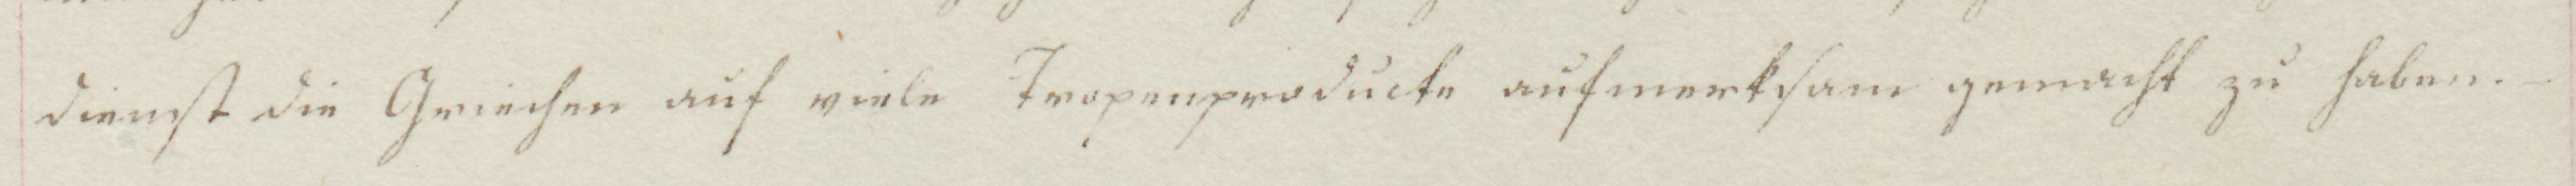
dienst die Griechen auf viele Tropenproducte aufmerksam gemacht zu haben. –
